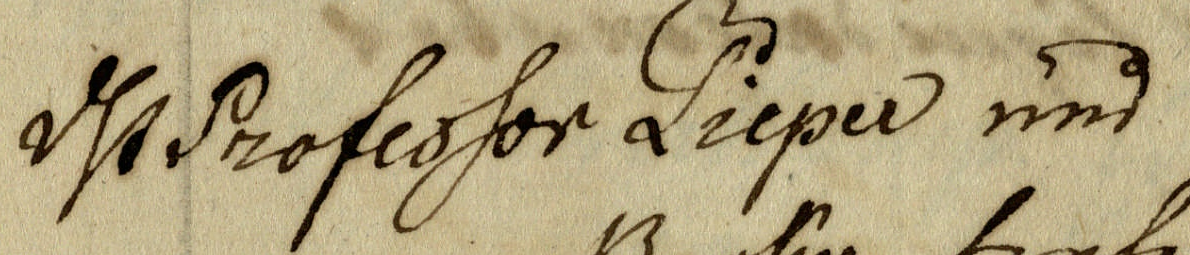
dh Professor Pieper und
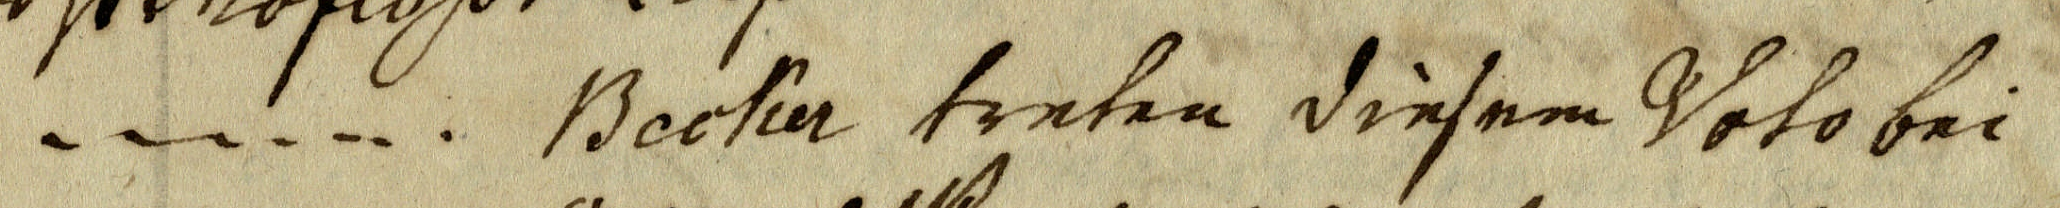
Becker treten diesem Voto bei
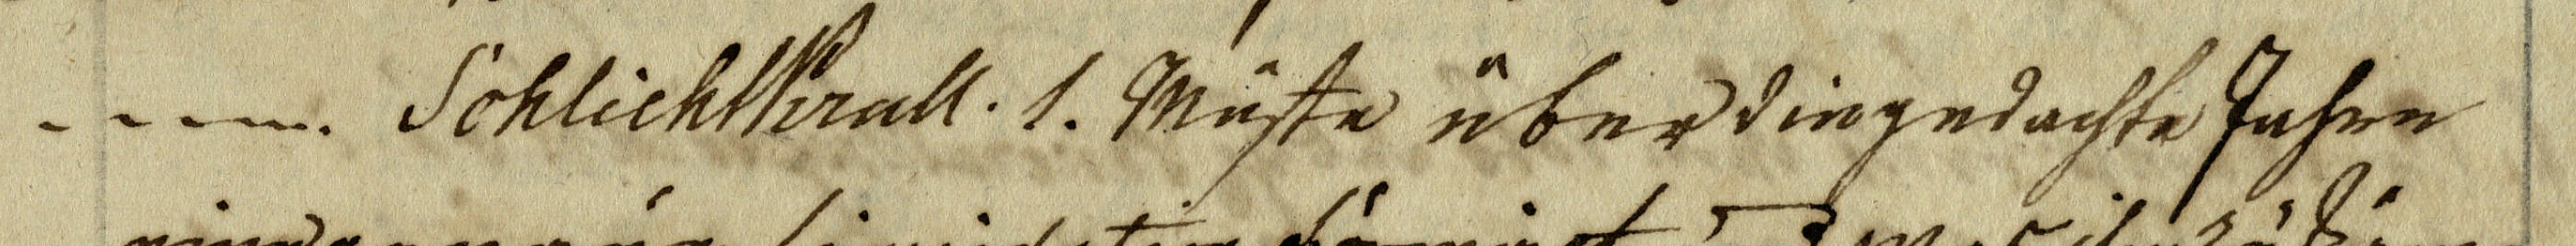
Schlichtkrull. 1. Müßte über die gedachte Jahre
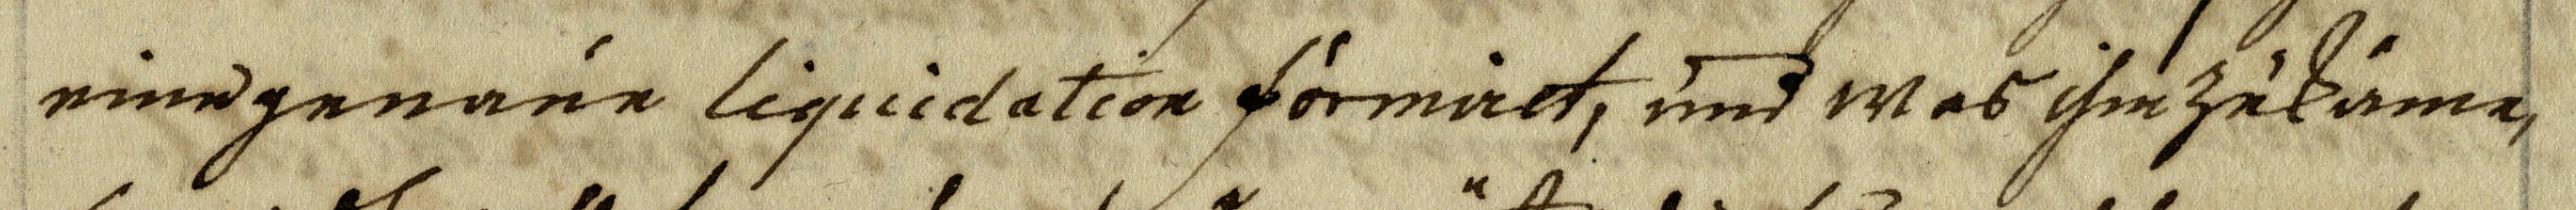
eine genaue liquidation formiret, und was ihm zukäme,
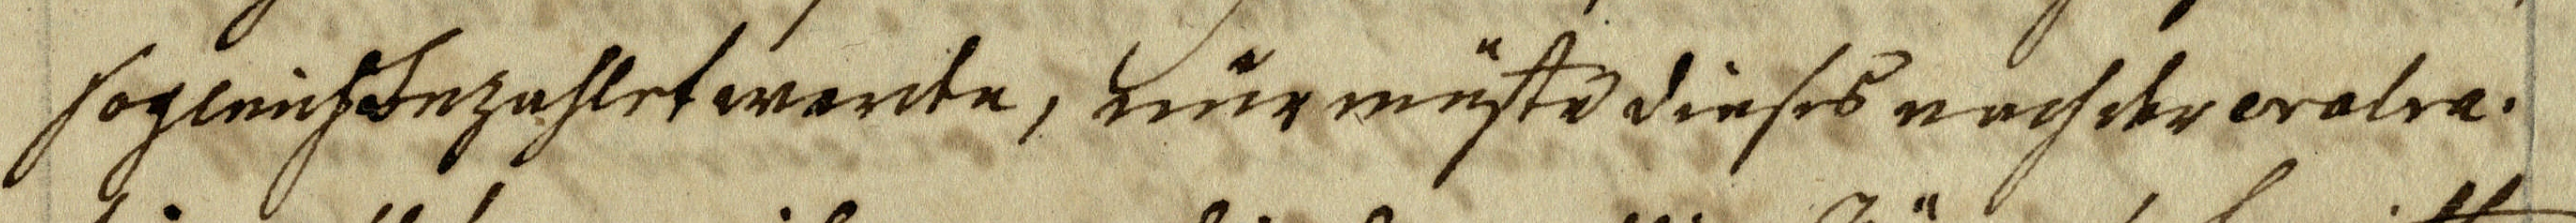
sogleich bezahlet werden, nur müßte dieses nach der eratra¬
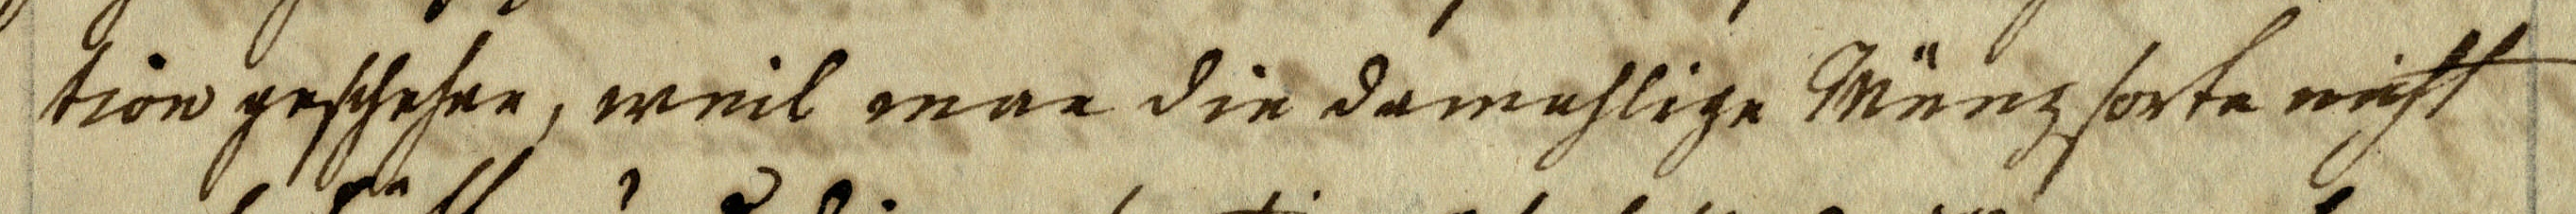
tion geschehen, weil man die damahlige Münzsorte nicht
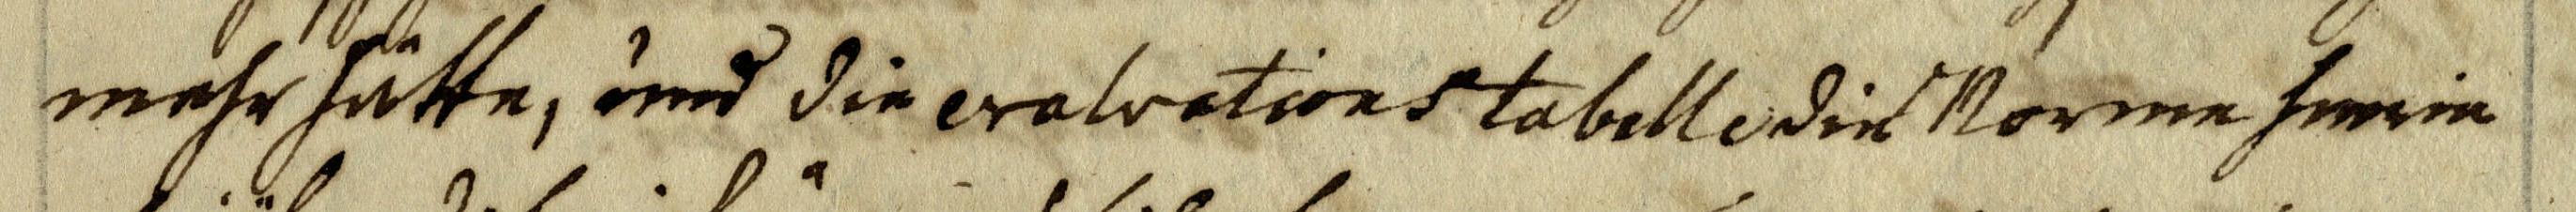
mehr hätte, und die eratrationstabelle die Norme hierin
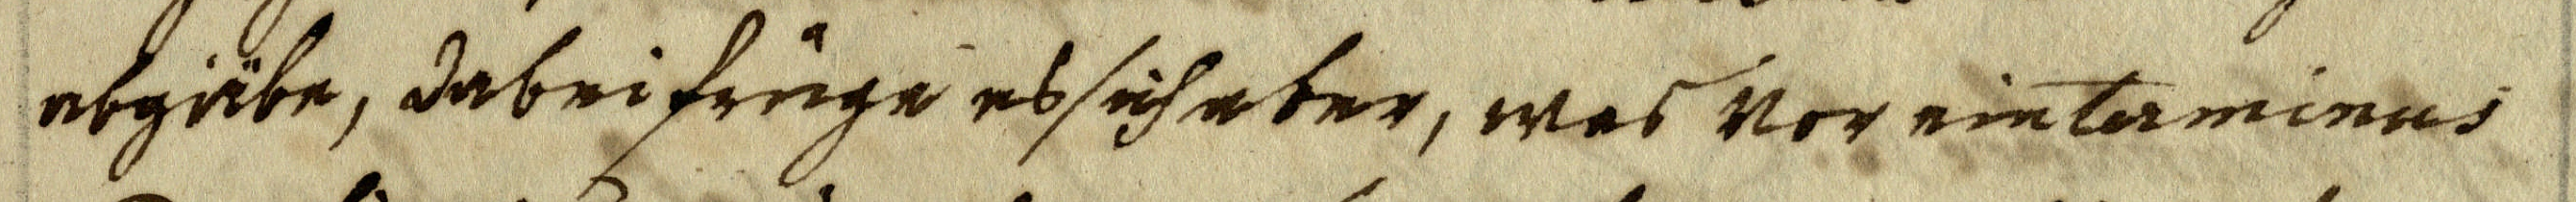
abgäbe, dabei früge es sich aber, was vor ein terminus
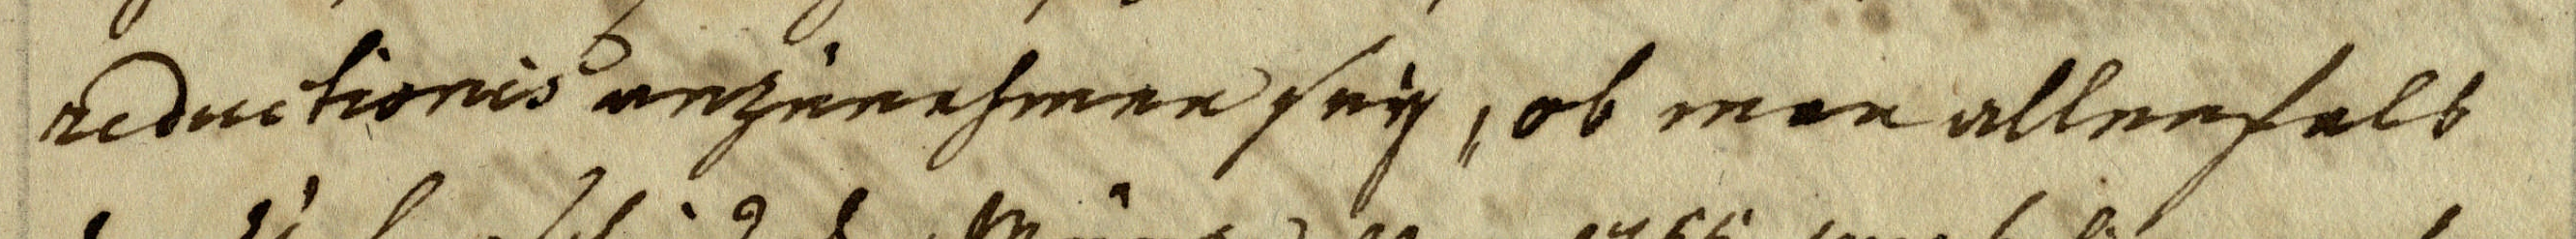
reductionis anzunehmen seÿ, ob man allenfals
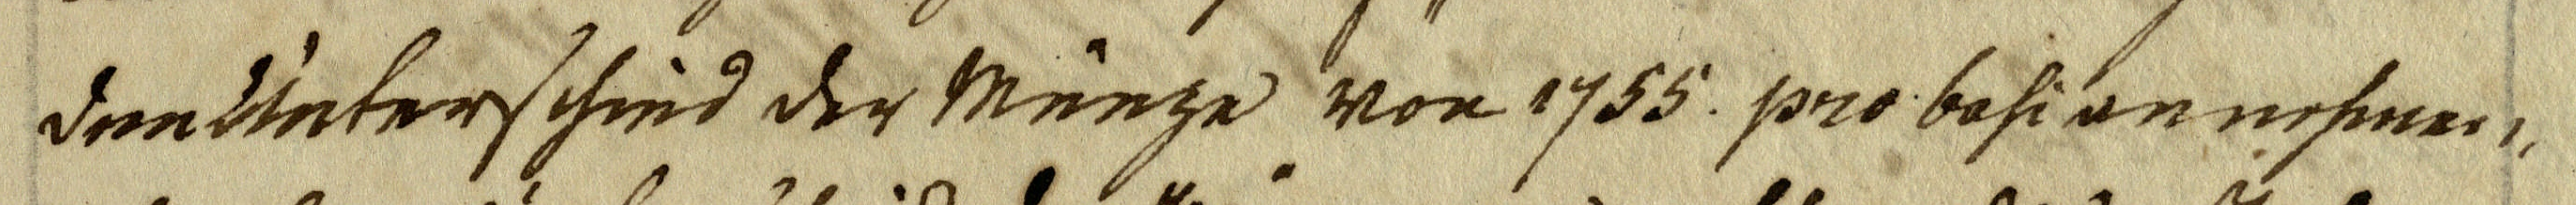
dem Unterschied der Münze von 1755 pro basi annehmen,
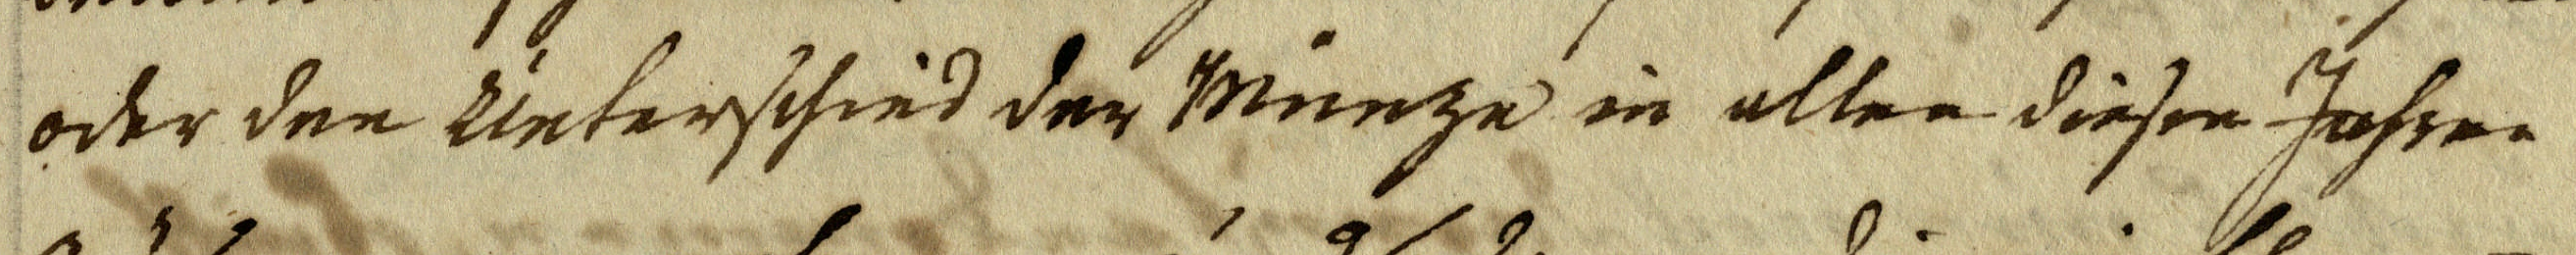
oder den Unterschied der Münze in allen diesen Jahren
